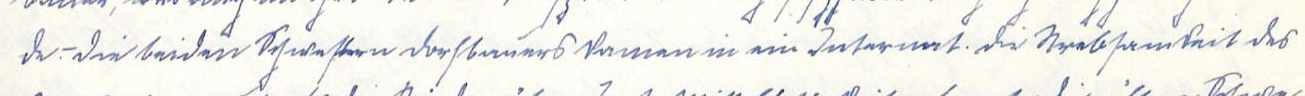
de- Die beiden Schwestern Dorfbauers kamen in ein Internat. Die Strebsamkeit des
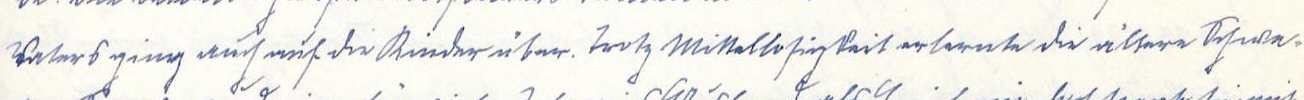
Vaters ging auch auf die Kinder über. Trotz Mittellosigkeit erlernte die ältere Schwer-
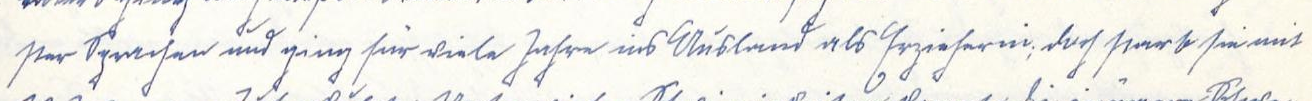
ster Sprachen und ging für viele Jahre ins Ausland als Erzieherin, doch starb sie mit
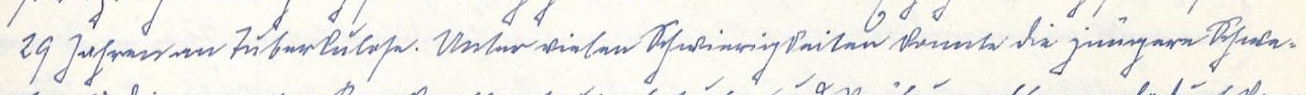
29 Jahren an Tuberkulose. Unter vielen Schwierigkeiten konnte die junger Schwe-
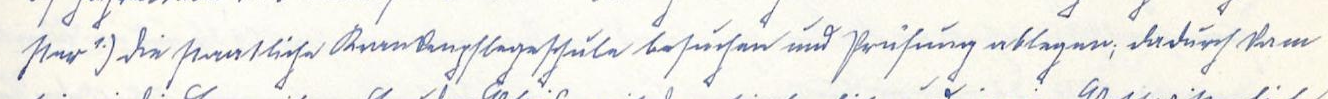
ster 1) die staatliche Krankenpflegeschule besuchen und Prüfung ablegen, dadurch kam
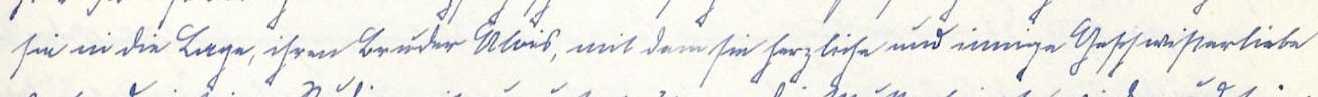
sie in die Lage, ihren Bruder Alois, mit den sie herzliche und innige Geschwisterliebe
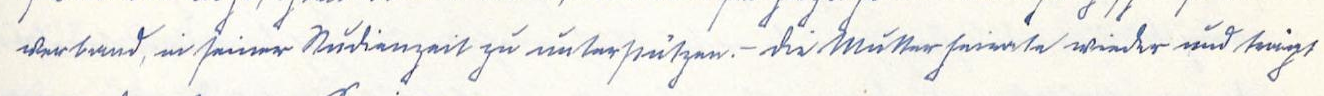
verband, in seiner Studienzeit zu unterstützen. - Die Mutter heirate wieder und trägt
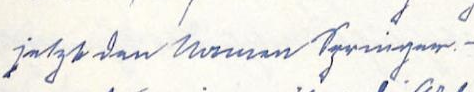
jetzt den Namen Springer.
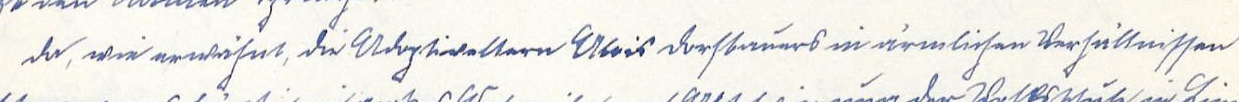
Da, wie erwähnt, die Adoptiveltern Alois Dorfbauers in ärmlichen Verhältnissen
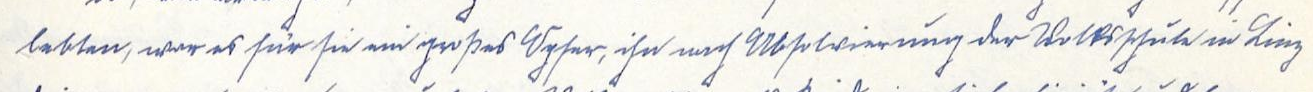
lebteb, war es für sie ein großes Opfer, ihn nach Absolvierung der Volksschule in Linz
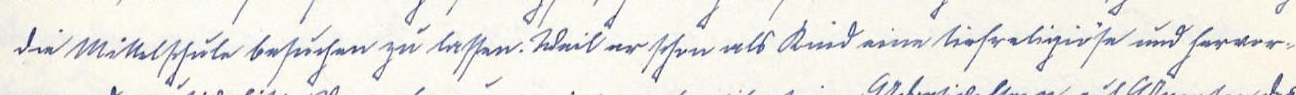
die Mittelschule besuchen zu lassen. Weil er schon als Kind eine tiefreligiöse und hervor-
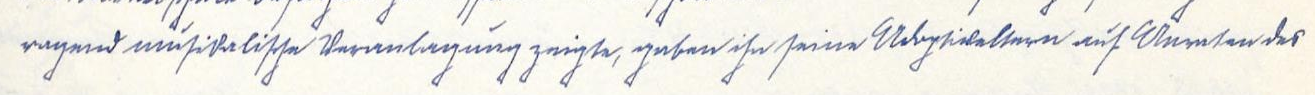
ragend musikalische Veranlagung zeigte, gaben ihn seine Adoptiveltern auf Anraten des
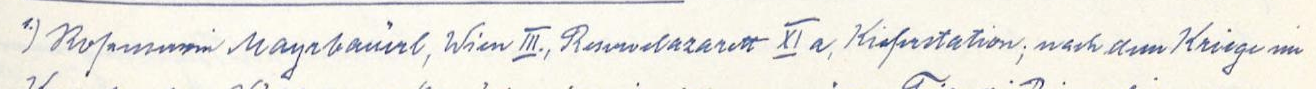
1) Rosemarie Mayrbäuerl, Wie III., Reservelazarett XI a, Kieferstation, nach dem Kriege im
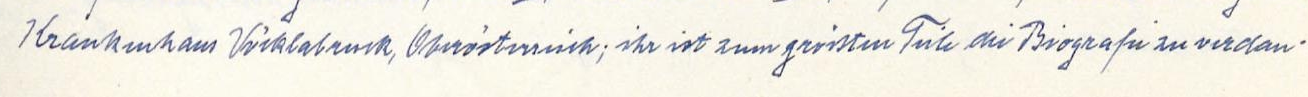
Krankenhaus Vöcklabruck, Oberösterreich; ihr ist zum größten Teile die Biografie verdanken.
